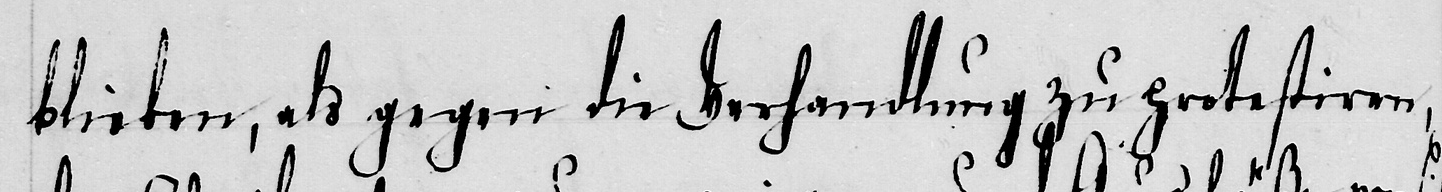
blieben, als gegen die Verhandlung zu protestiren,
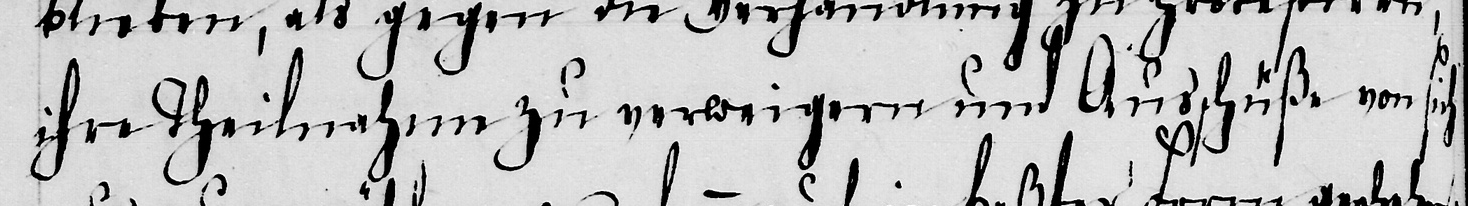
ihre Theilnahme zu verweigern und Ausschüße von s¬
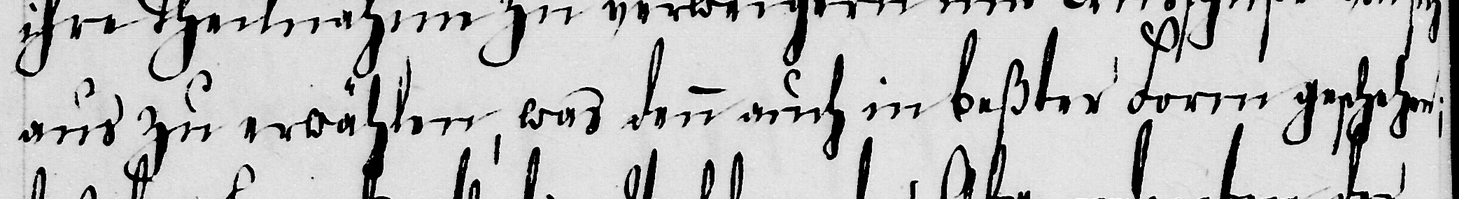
aus zu erwählen, was denn auch in beßter Form geschehen;
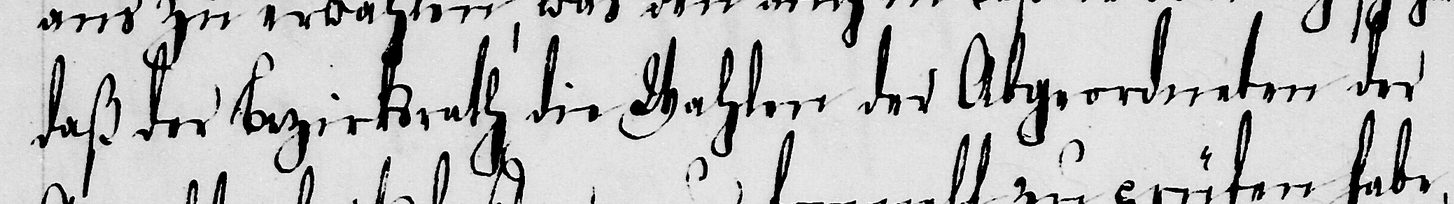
daß der Bezirksrath die Wahlen der Abgeordneten der
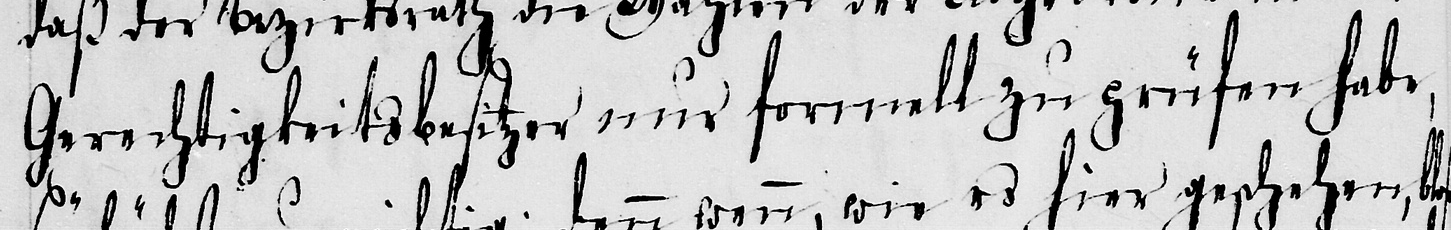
Gerechtigkeitsbesitzer nur formell zu prüfen habe,
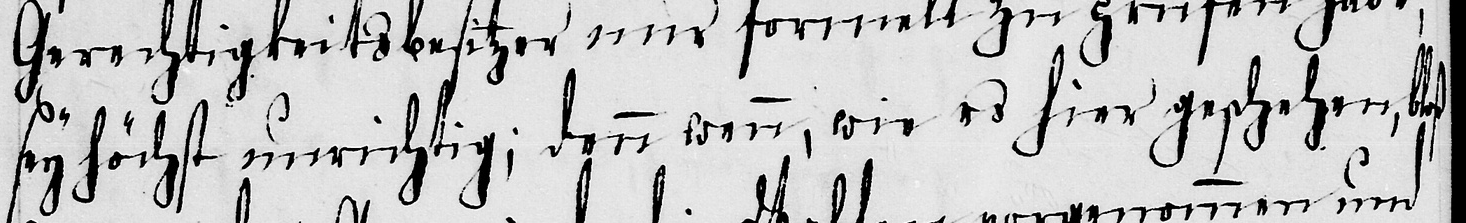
sey höchst unrichtig; denn wenn, wie es hier geschehen, bl¬
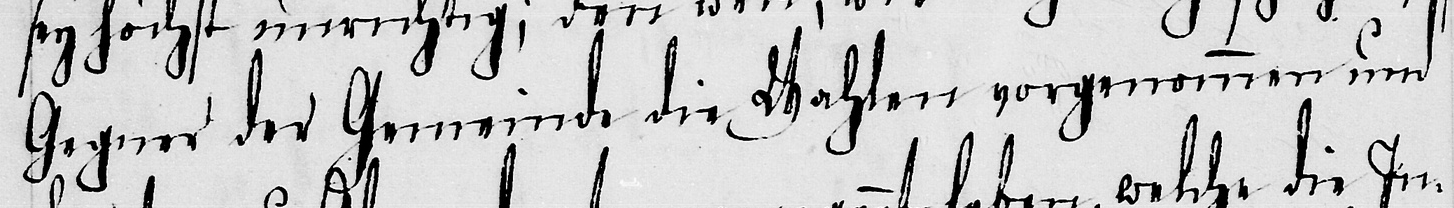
Gegner der Gemeinde die Wahlen vorgenommen und
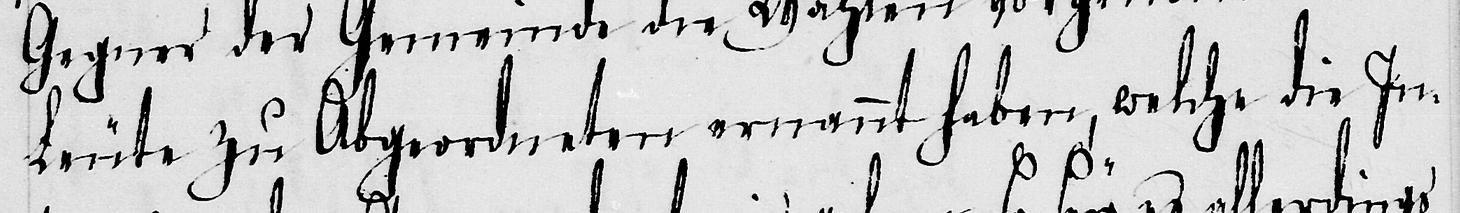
Leute zu Abgeordneten ernannt haben, welche die In¬
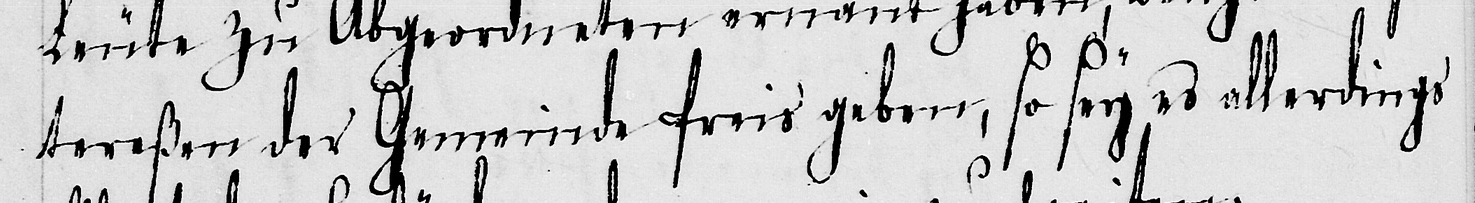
tereßen der Gemeinde Preis geben, so sey es allerdings
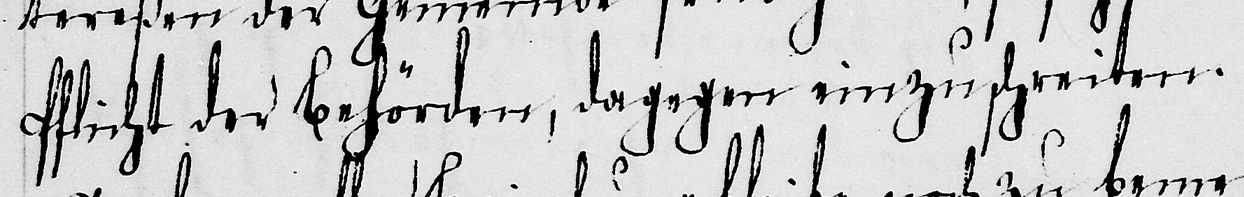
Pflicht der Behörden, dagegen einzuschreiten.
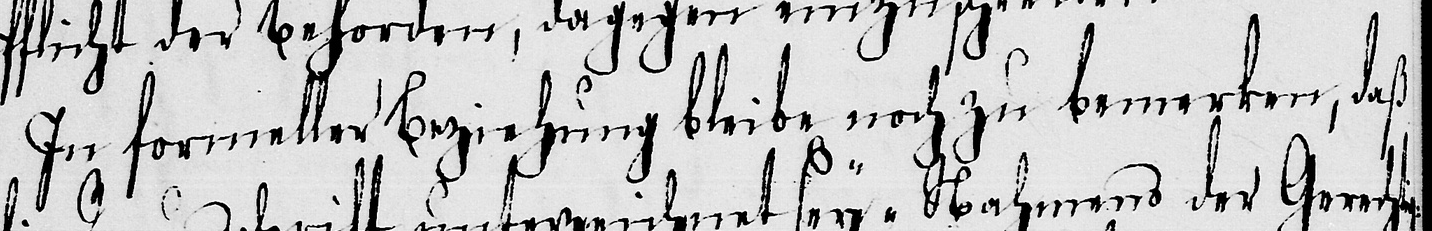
In formeller Beziehung bleibe noch zu bemerken, daß
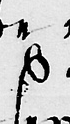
es
